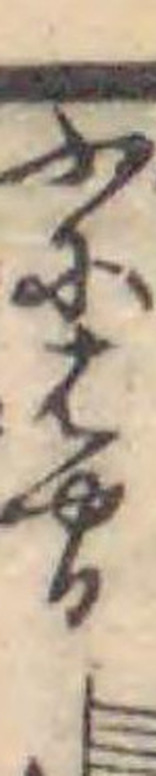ふにはやる
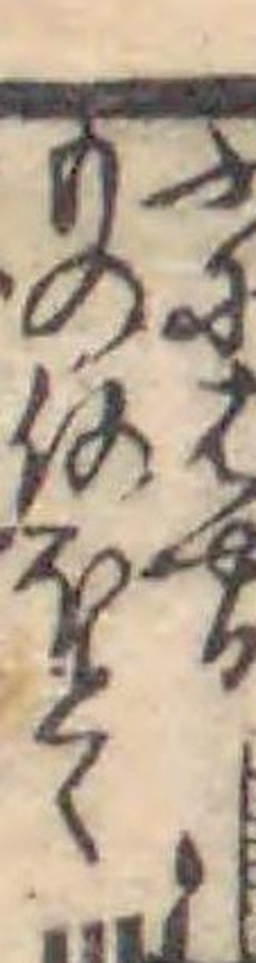もの何ほとゝ
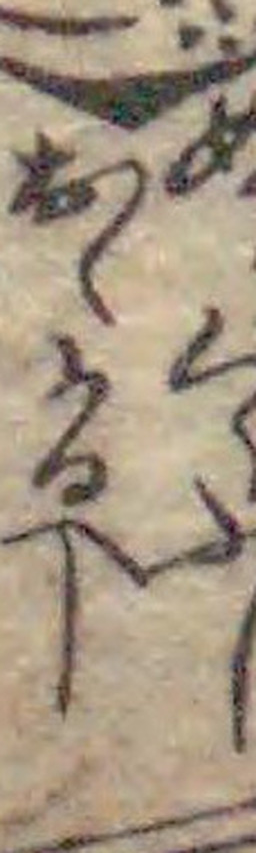おゝかるへし
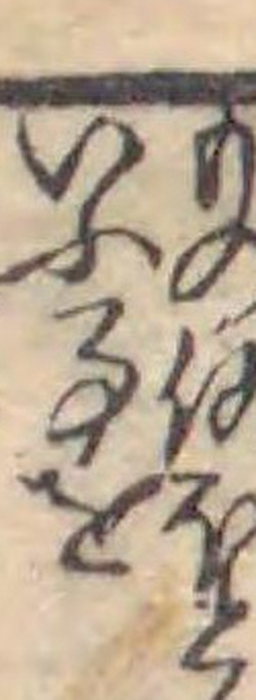いふ事を
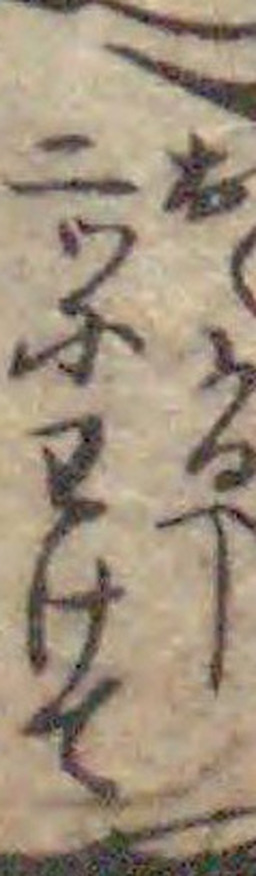二つにわけて
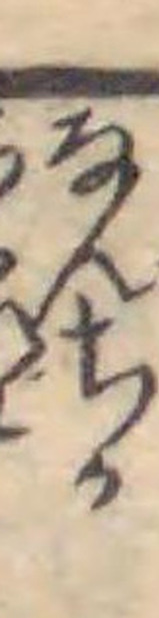なんちか
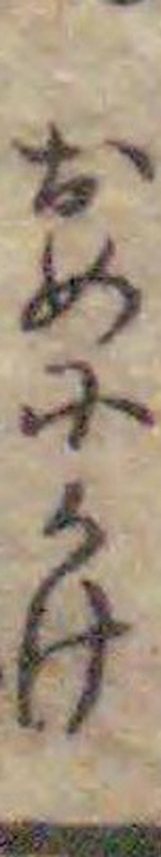おめにかけ
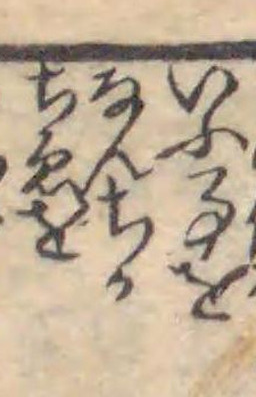ちゑを
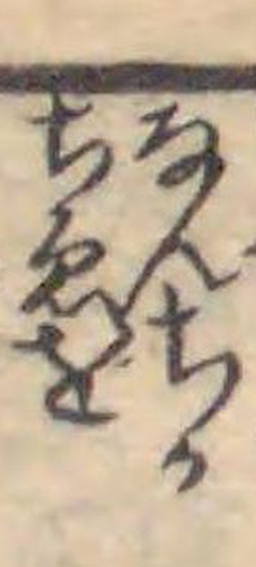ちゑを
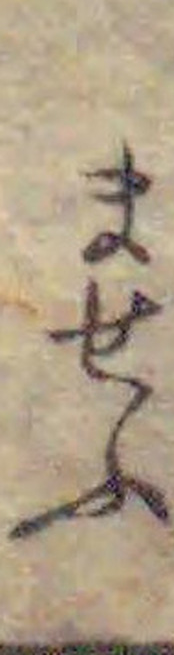ませふ

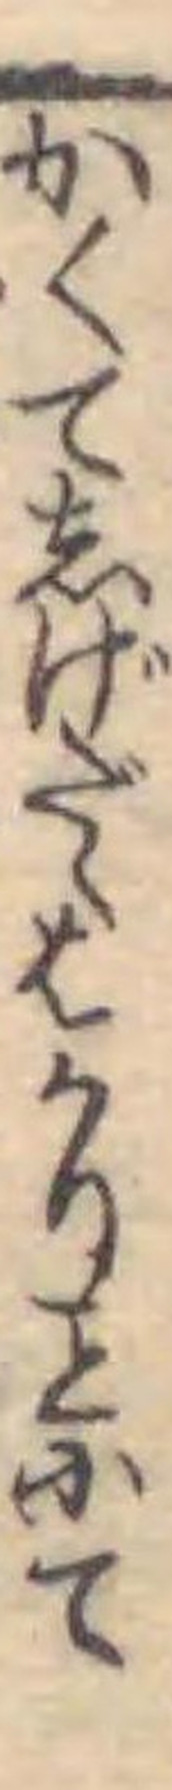かくてしげだゝはかりことにて
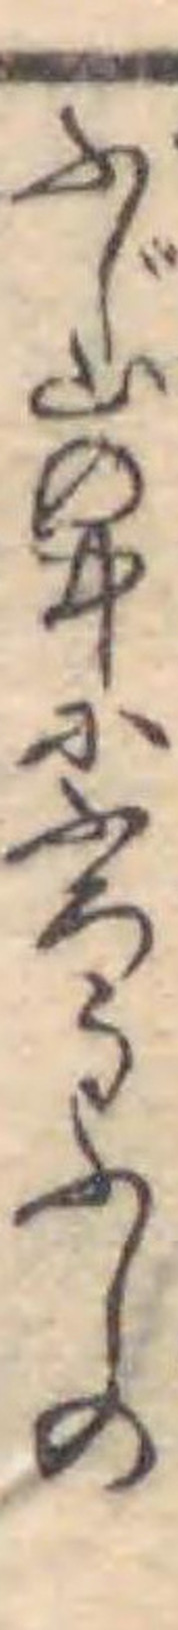ふじ山の中にふろうふしの
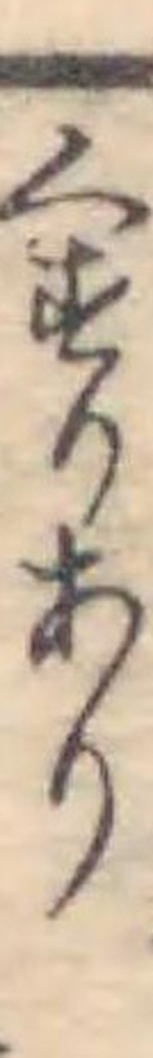くすりあり
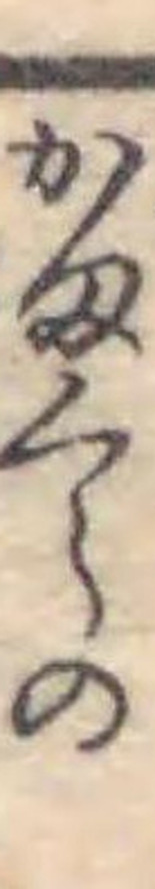あまくらの
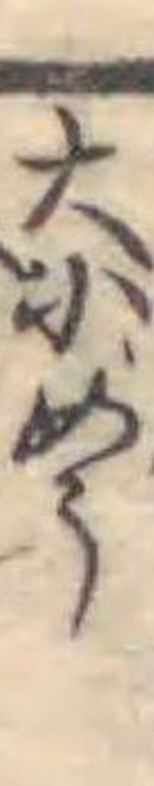大小めう
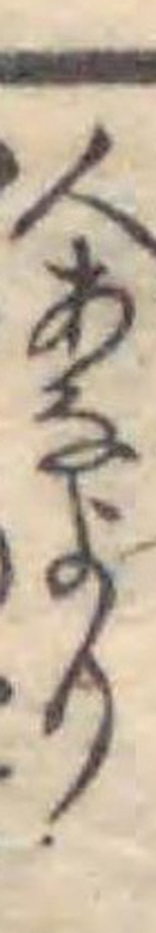人あなより
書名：文武二道万石通 : 3巻
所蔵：国立国会図書館 National Diet Library, JAPAN
